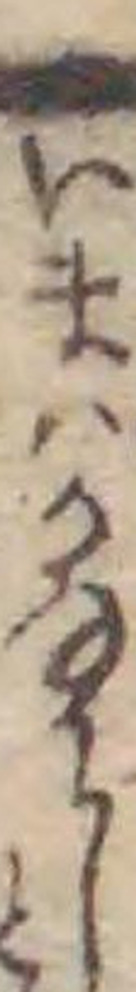いまはかなはし
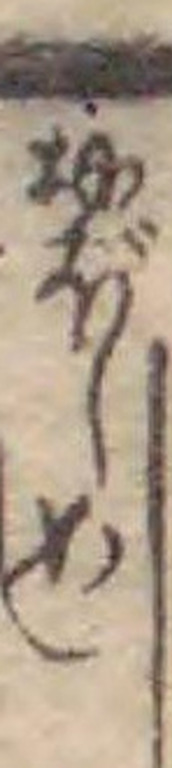おぼしめし
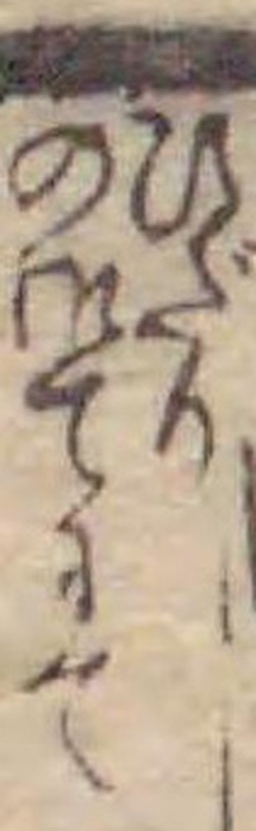の御てにて
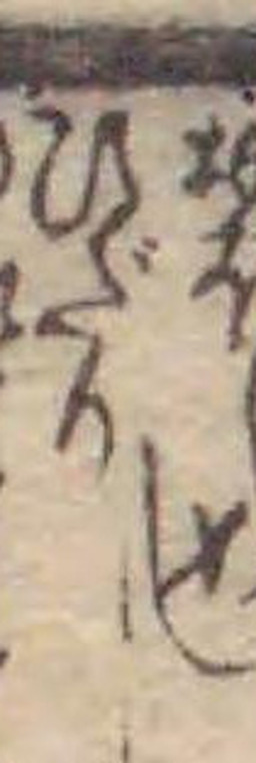ひだり
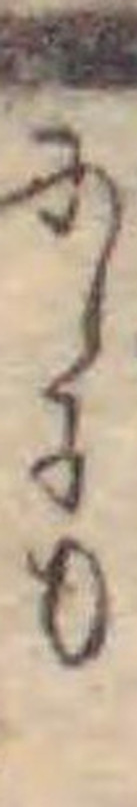にしにも
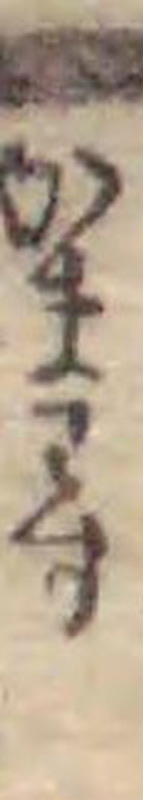かまわす
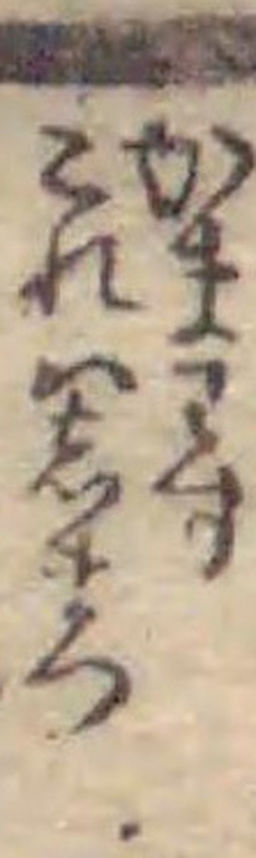これはしまつ
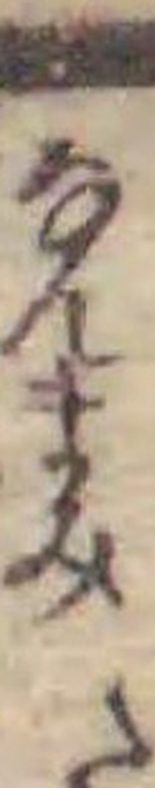なんまみ
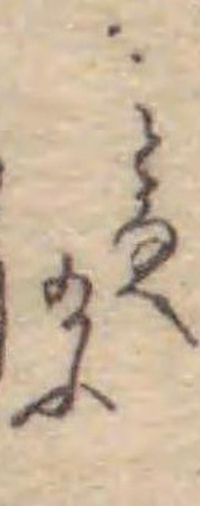となへ
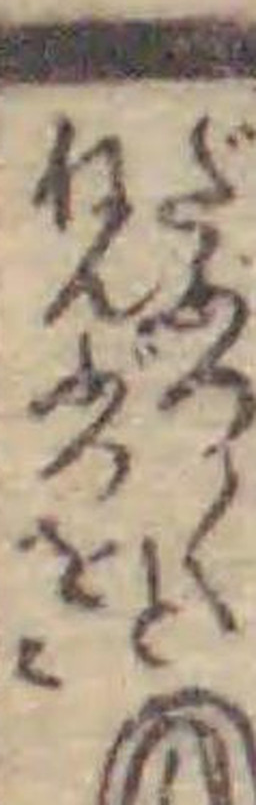ねんぶつを

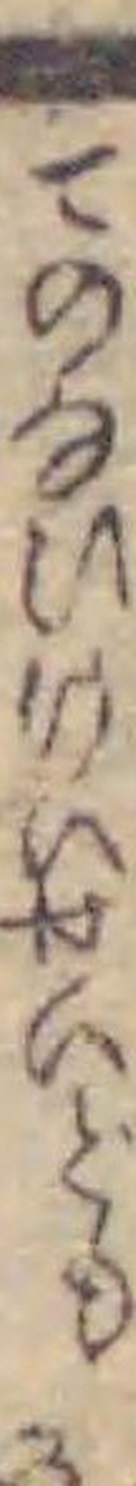てのないけいせいども
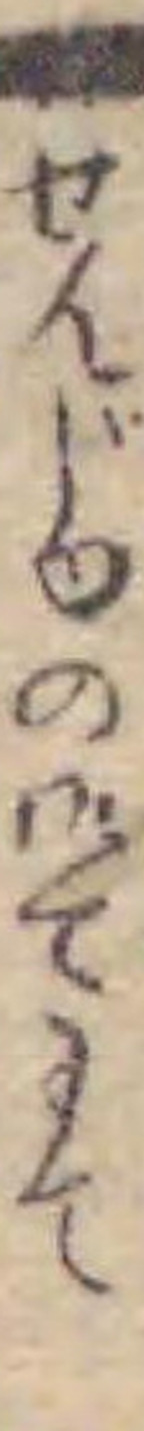せんじゆの御てにて
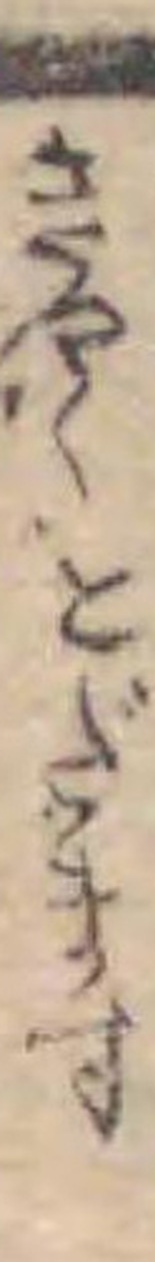きやくをだます
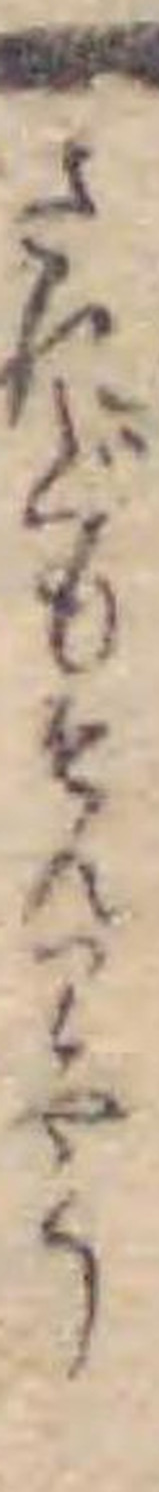されどもそんりやう
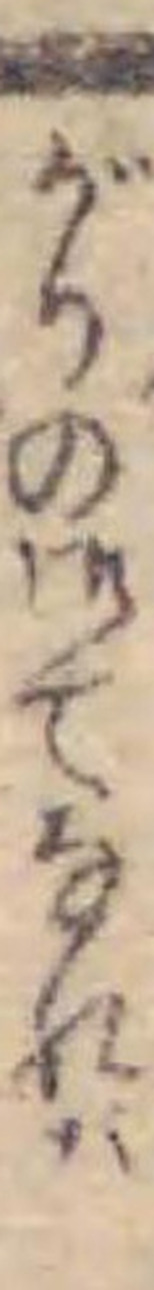がりの御てなれば
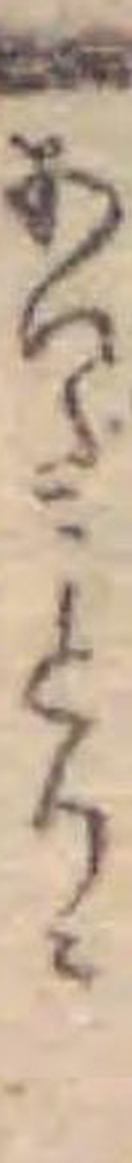あいだにとりに
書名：大悲の千六本 : 1巻
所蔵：国立国会図書館 National Diet Library, JAPAN
